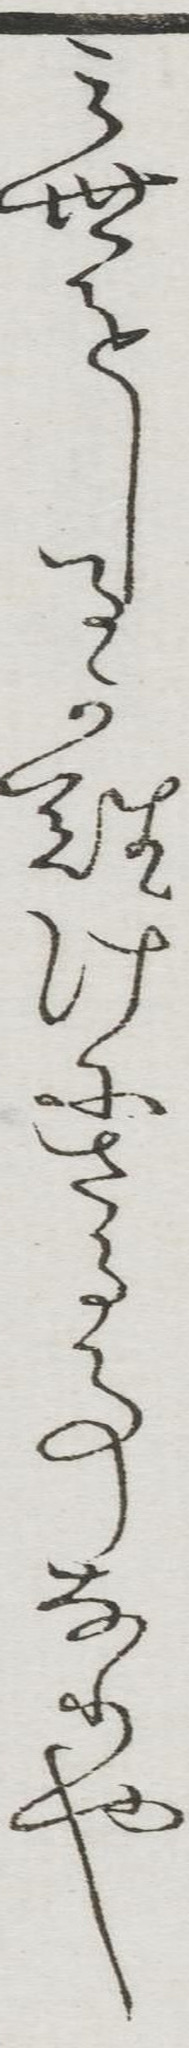み世をしるかなけにさる事なりや
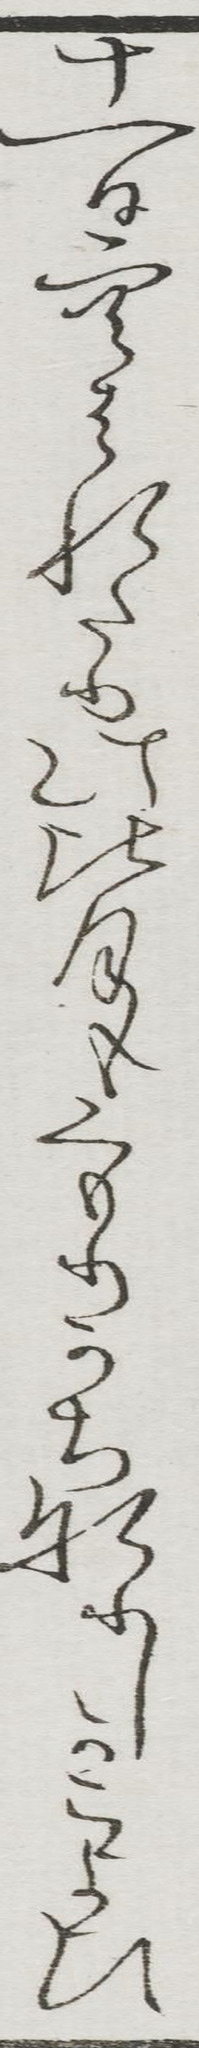十一日空はれたり此頃月もくもりかちなりしかこよひ
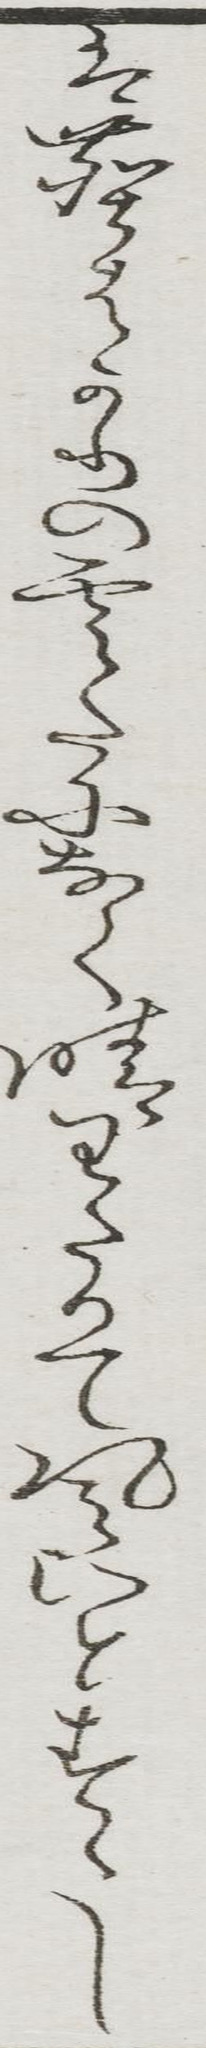は塵はかりの雲たになく晴わたりて風いとすゝし
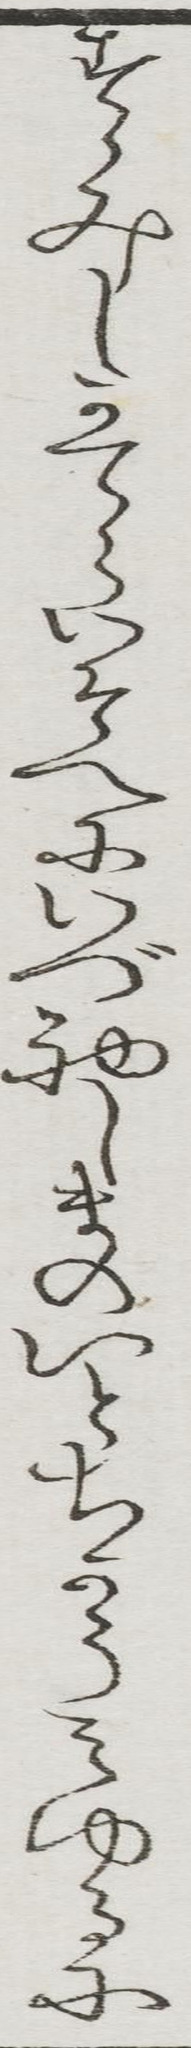すゝみしかてらいそへにいづ初しまのいとちかうみゆるに
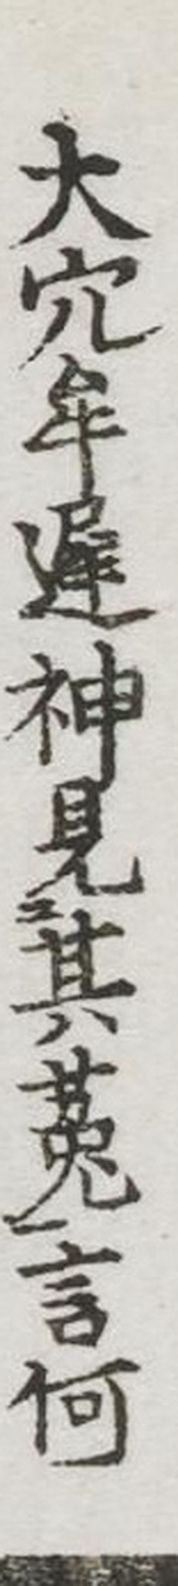大穴牟遅神見其菟言何
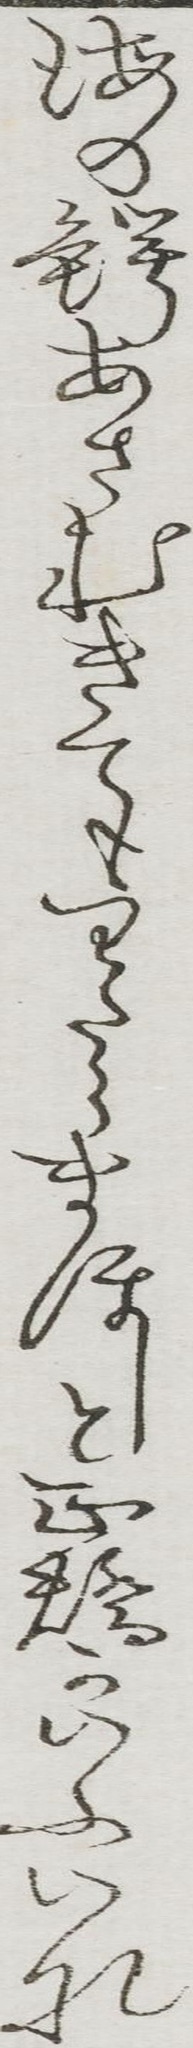海の鰐あさむきてもわたらまほしと正矯かいふいな
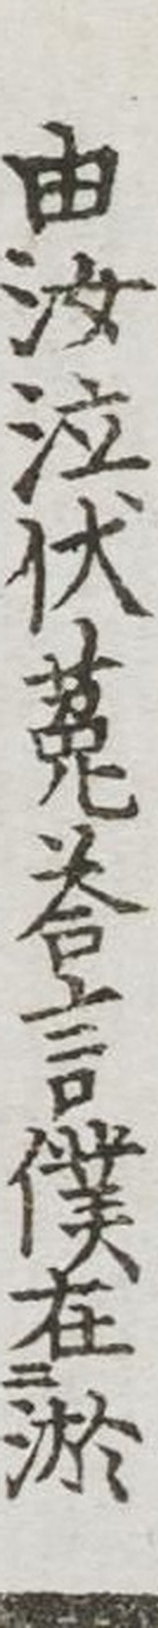由汝泣伏菟答言僕在淤
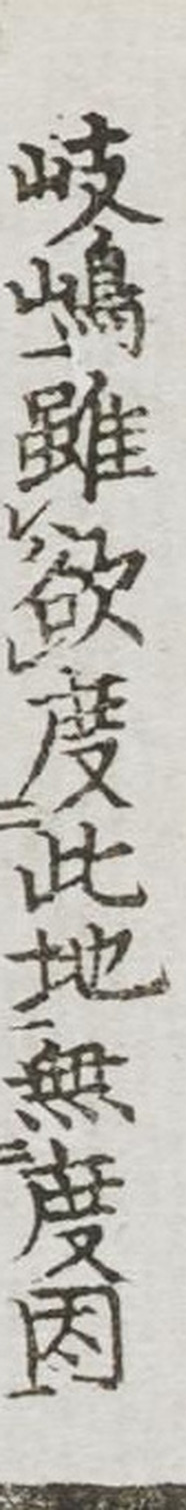岐嶋雖欲度此地無度因
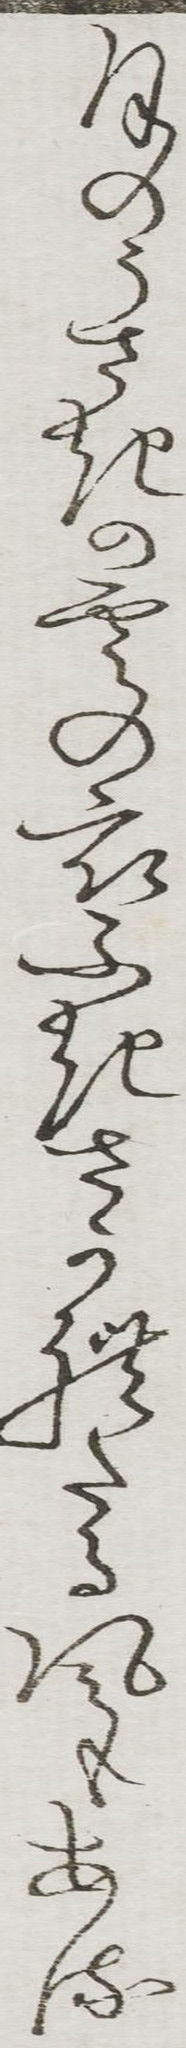月のうさきの雲の衣ふきさかれたる風もある
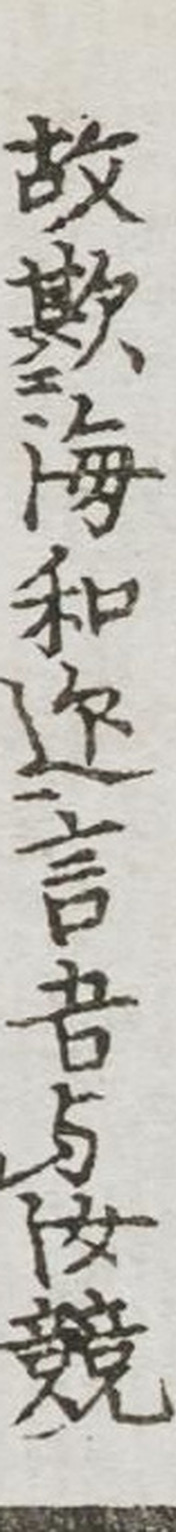故欺海和迩言吾与汝競
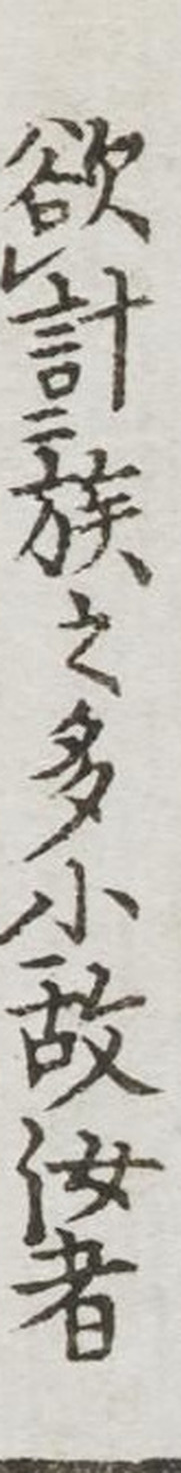欲計族之多少故汝者
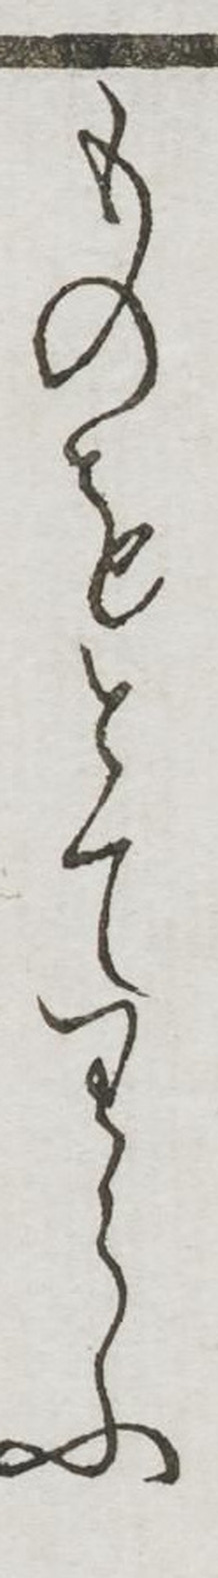ものをとてわらふ

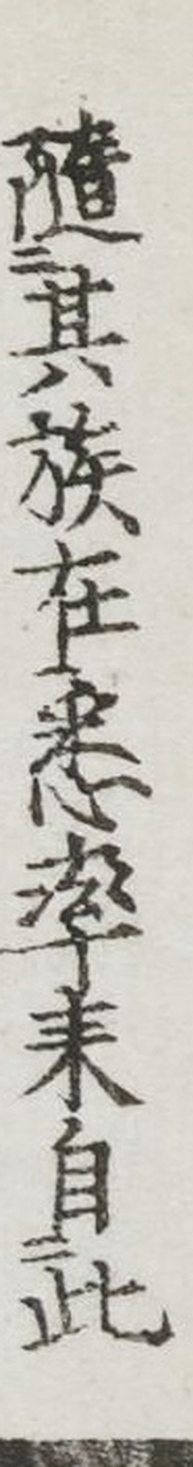隨其族在悉率来自此
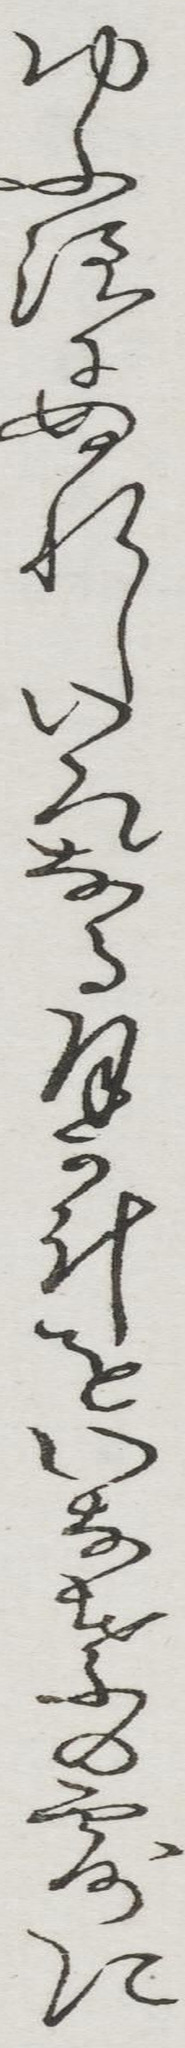ゆふ浪にぬれしいろなる月かけをいな葉の露に
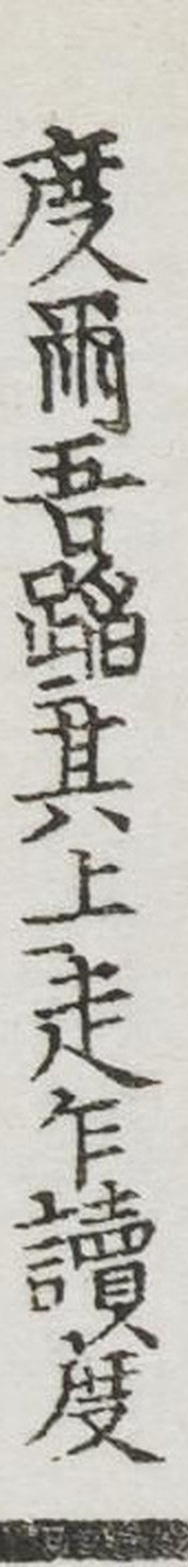度爾吾踏其上走乍読度
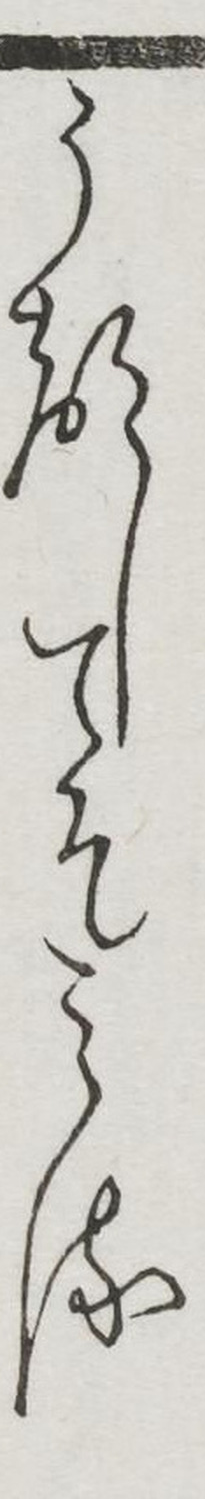うつしてそみる
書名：挿画熱海日記　全
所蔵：東京大学地震研究所図書室 Earthquake Research Institute Library, The University of Tokyo, JAPAN
